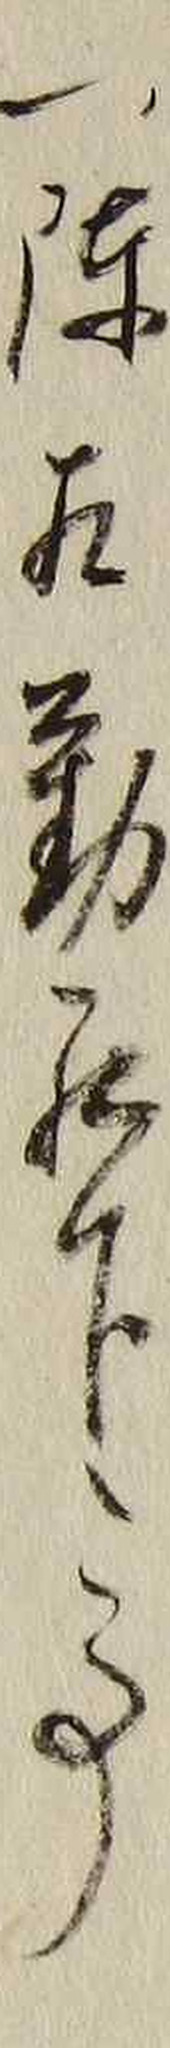一陣相勤罷下候事
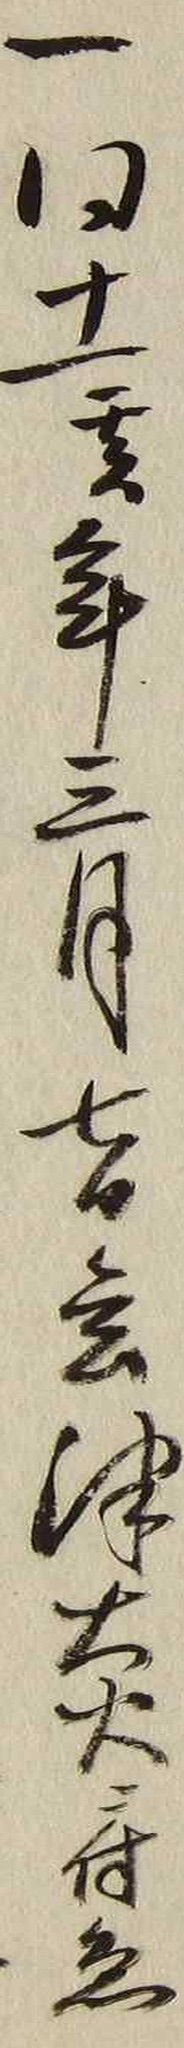一同十一亥年三月七日会津大火ニ付急
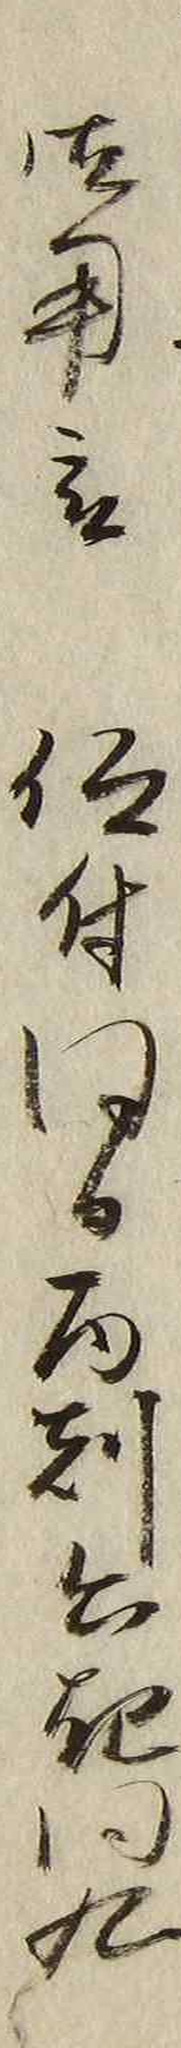御用被仰付同日酉刻出起同九

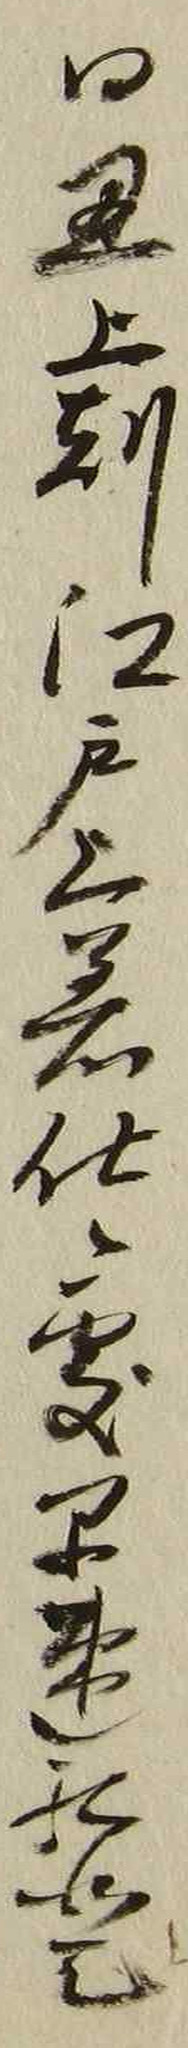日丑上刻江戸上着仕候処早速罷登
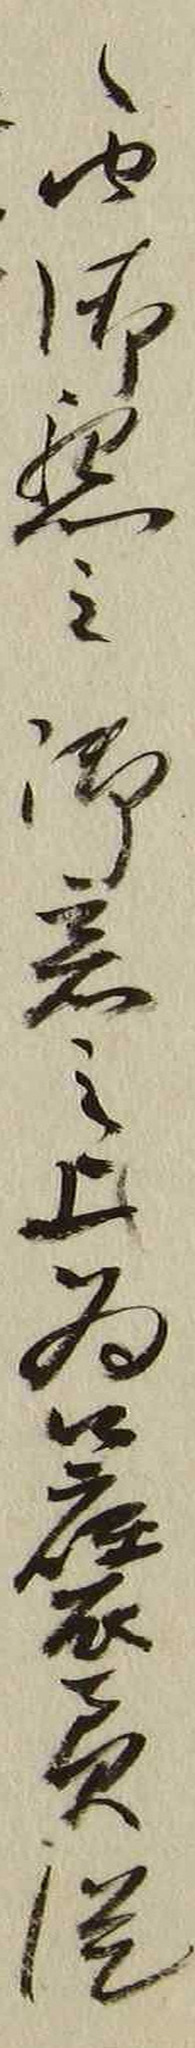之由御懇之御意之上為御褒美従
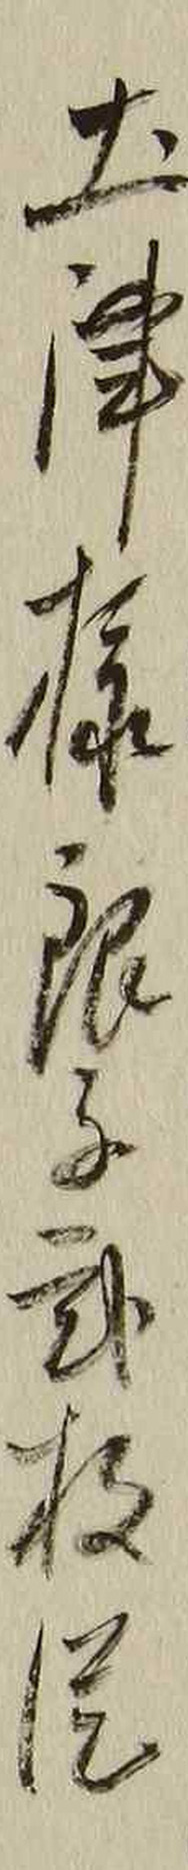土津様銀子弐枚従
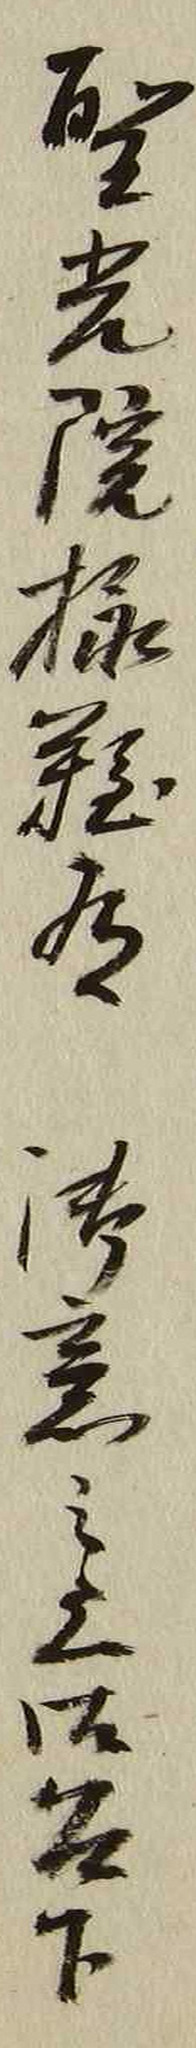聖光院様難有候御意之上御召下
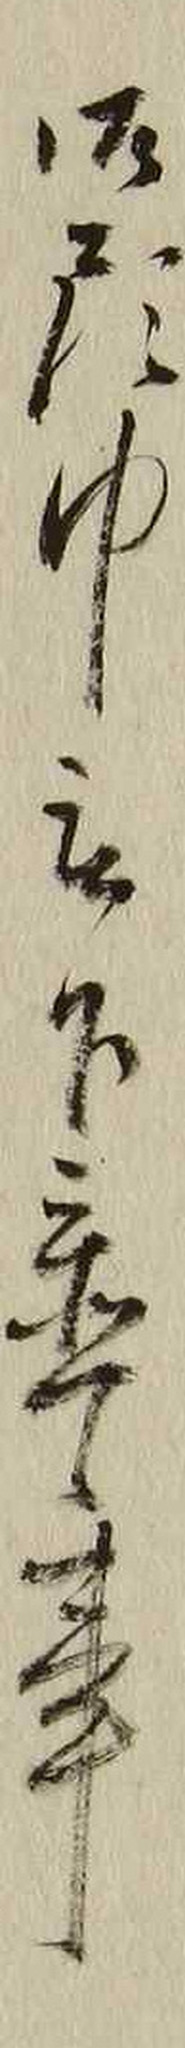御頭巾被下置候事
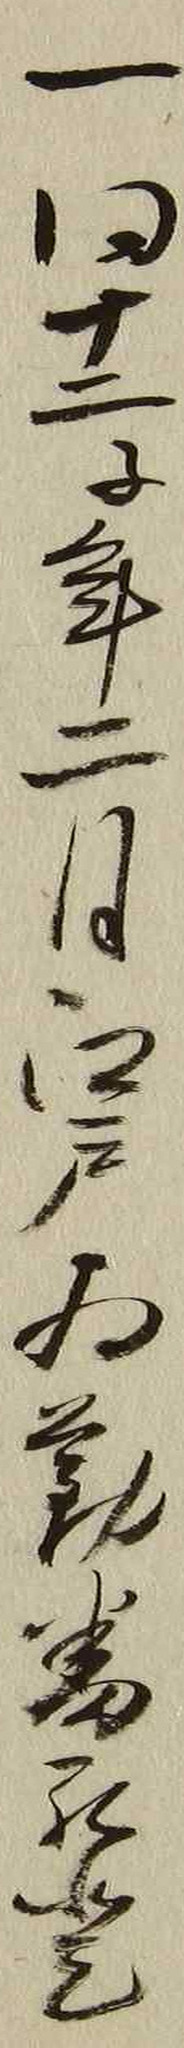一同十二子年二月江戸為勤番罷登
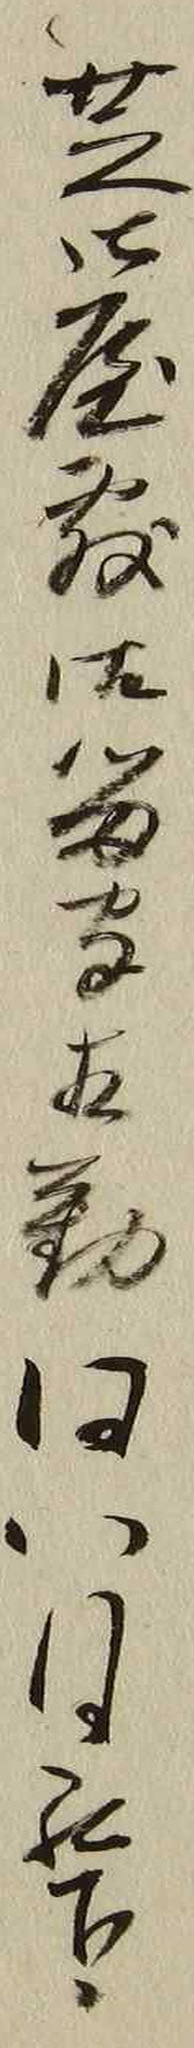芝御屋敷御留守相勤同八月罷下候
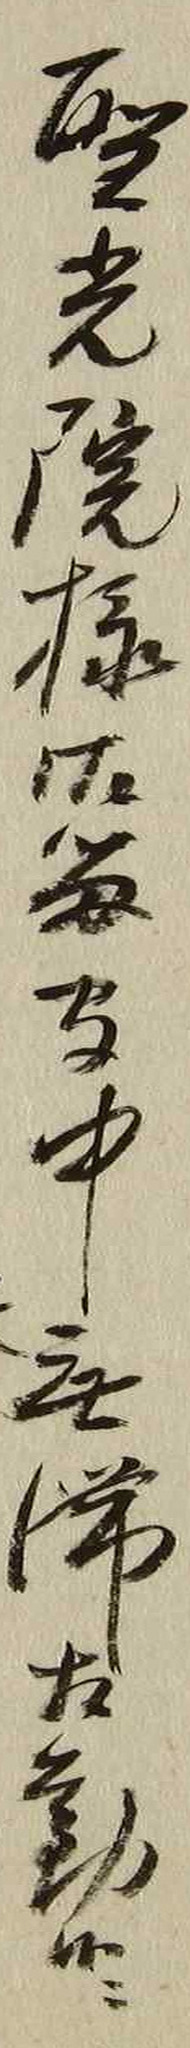聖光院様御留守中無滞相勤候ニ
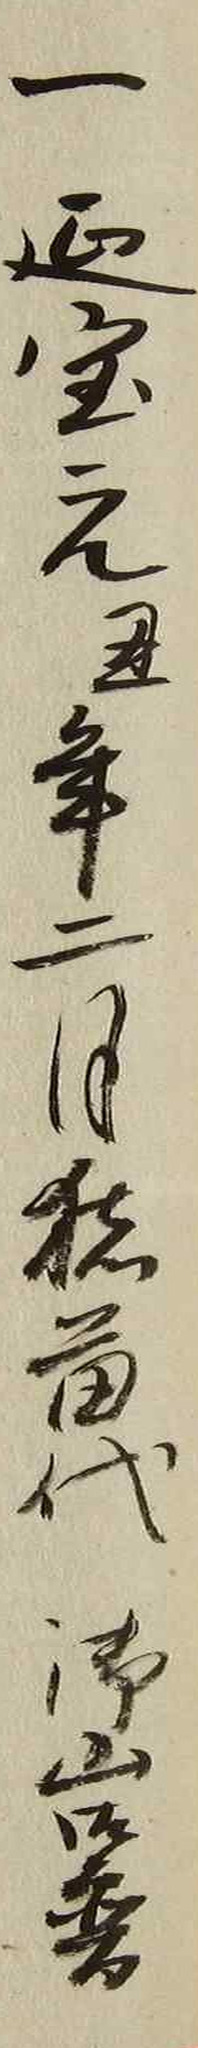一延宝元丑年二月猪苗代御山御普
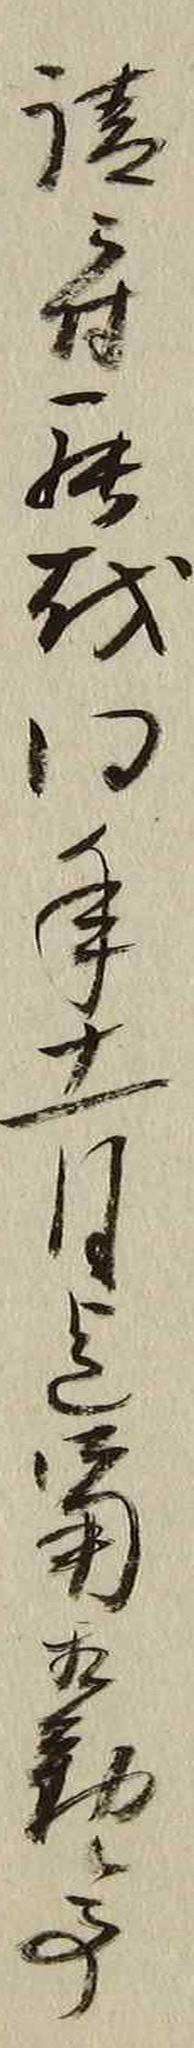請ニ付罷越同年十一月迄御用相勤候事
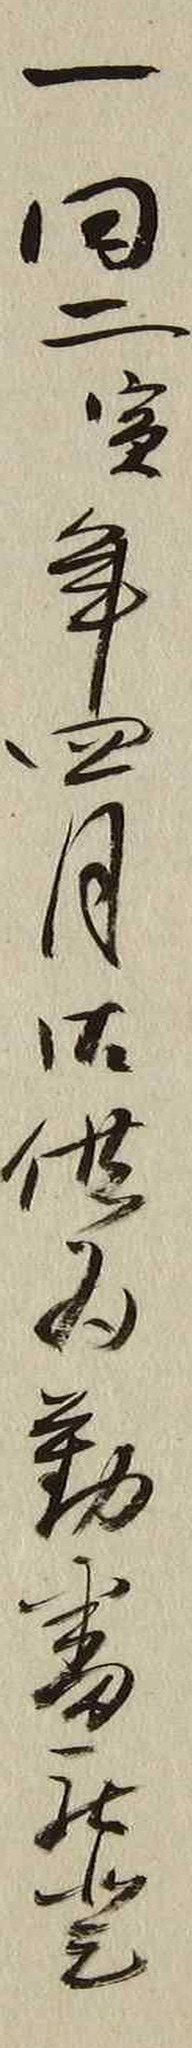一同二寅年四月御供為勤番罷登
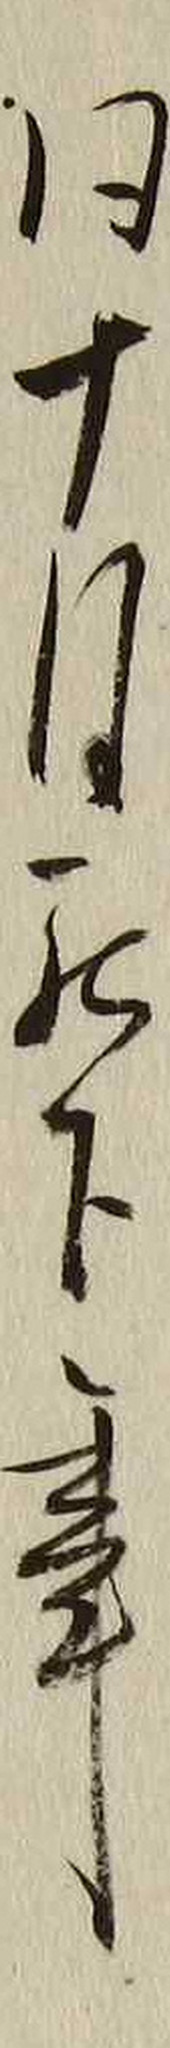同十月罷下候事
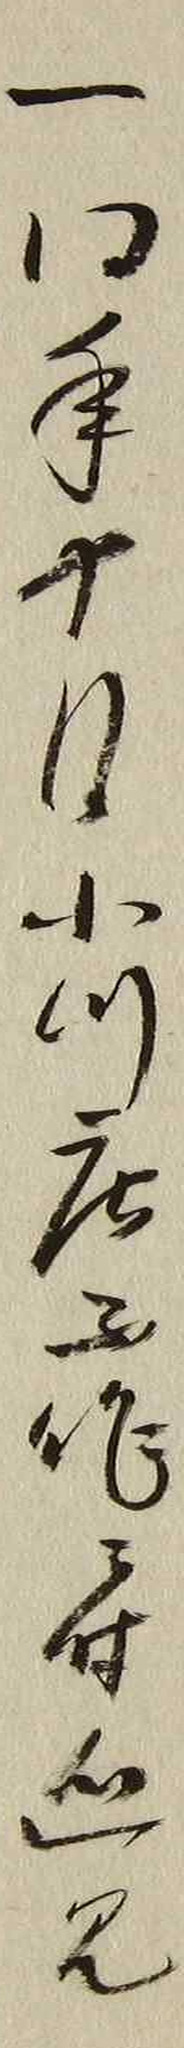一同年十月小川庄不作ニ付ニ巡見
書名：諸士系譜　巻之352　す之部2
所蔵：会津若松市立会津図書館
